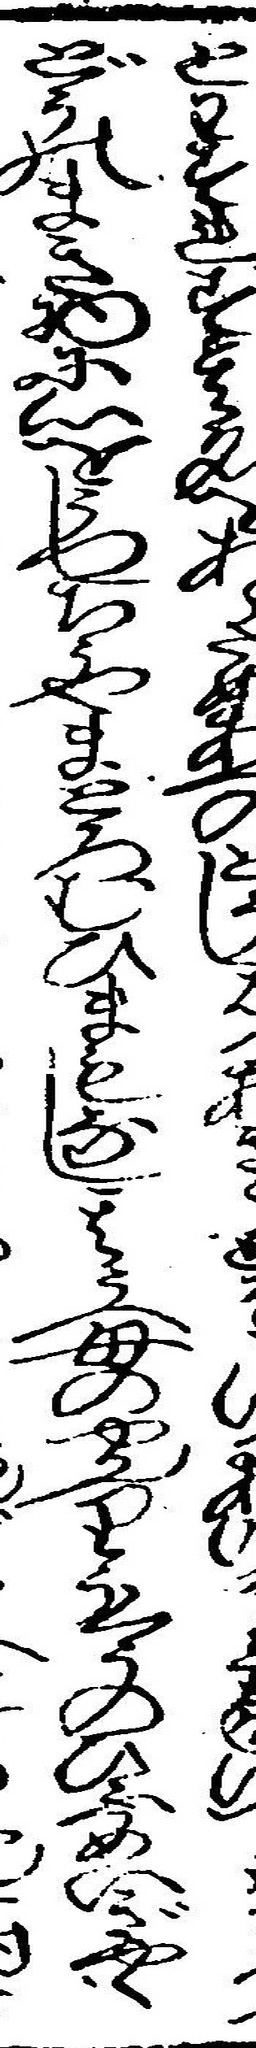どうのまき物に心をうつしちうやまとろむひまもなし其うへ母のやかんりうくうのひふう？めいぎやく
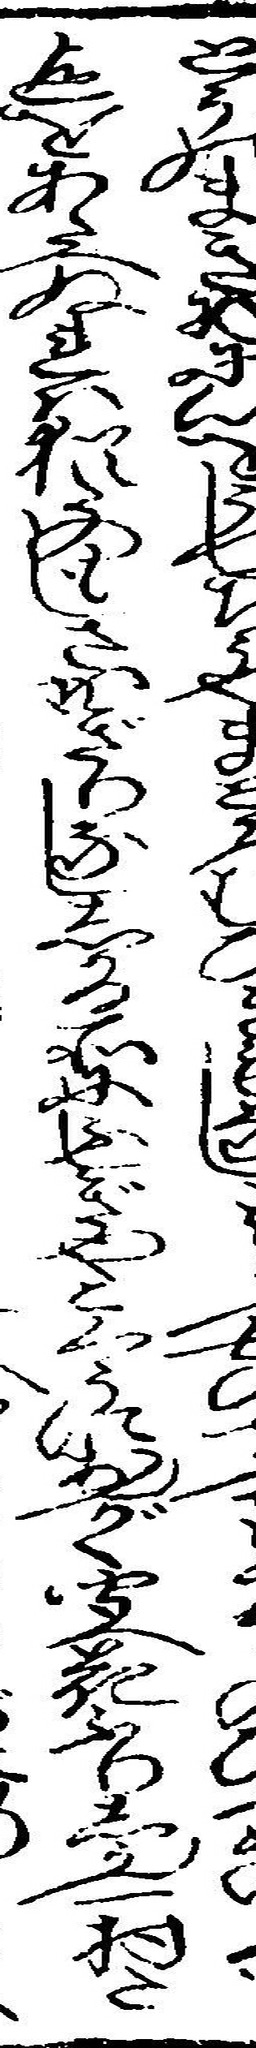迄をあたへぬれは猶たのもしさかぎりなししかる所にふしぎやこくうにおんがく聞へ花ふりしうん一村た
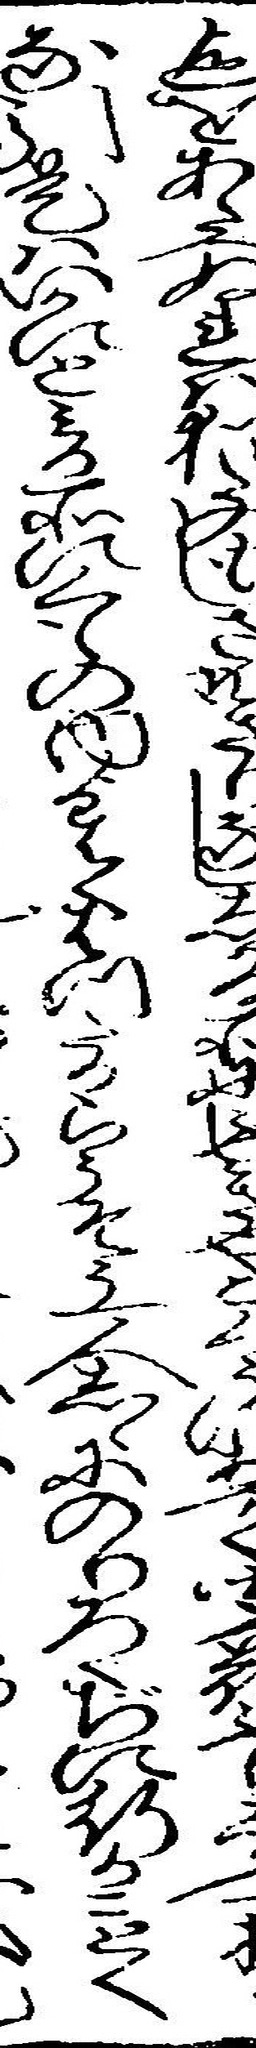な引是はいかにとみる所にくもの内ゟはくはつたるらうそう一人しゝにのりろくぢに行かことく
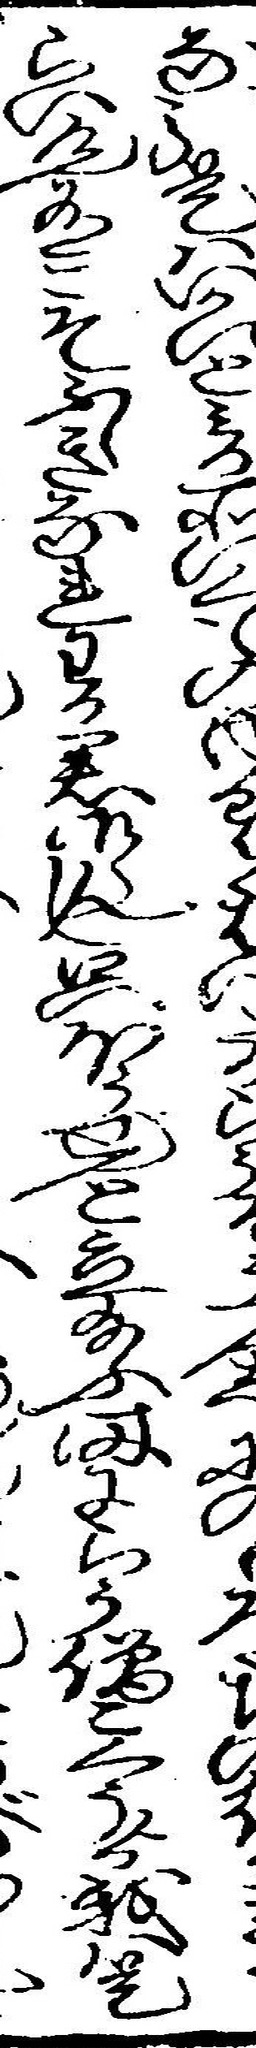らいけん有こそふしきなれわか君御らんし只ほうせんと立給ふ時にらう僧こくうゟ我は是
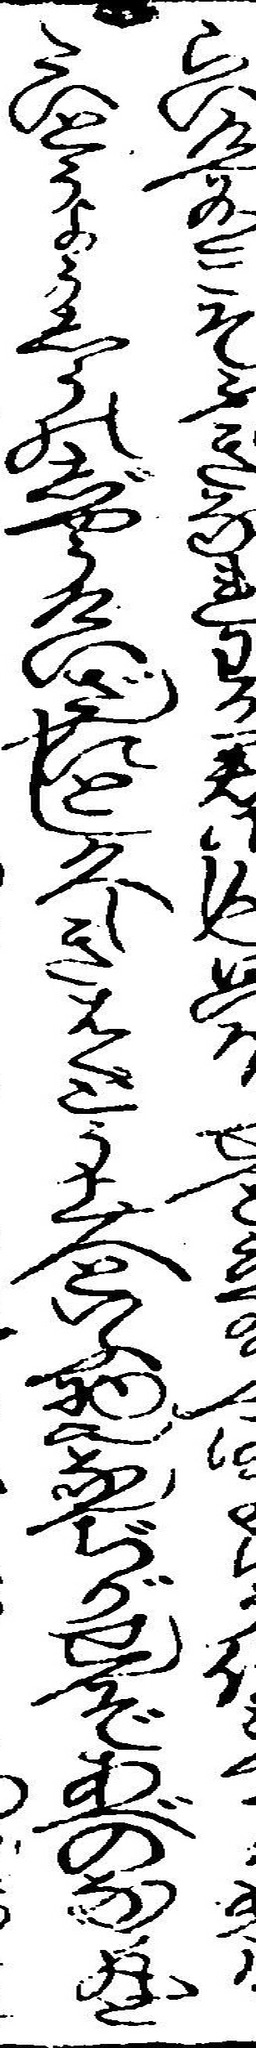たいとうようしうのじやうけいざんにとし久しきはくとう上人といふ物也なんぢがせんぞあべのなか丸と
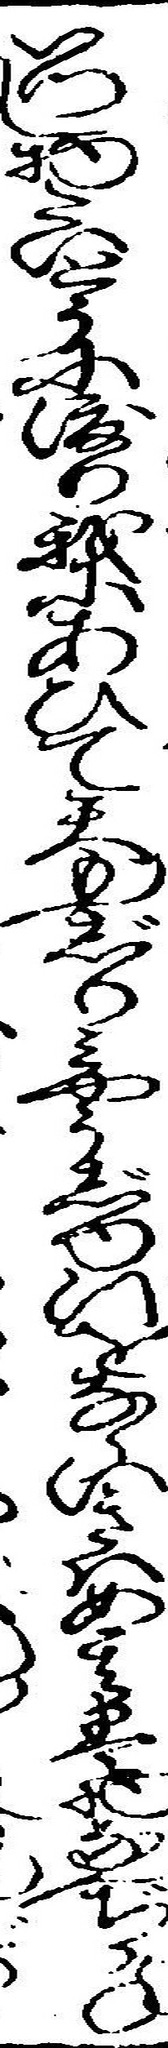いつし物たいとうに渡り我にあひて天もんじりみやうじゆつをならいきはめ其書物なんぢか手
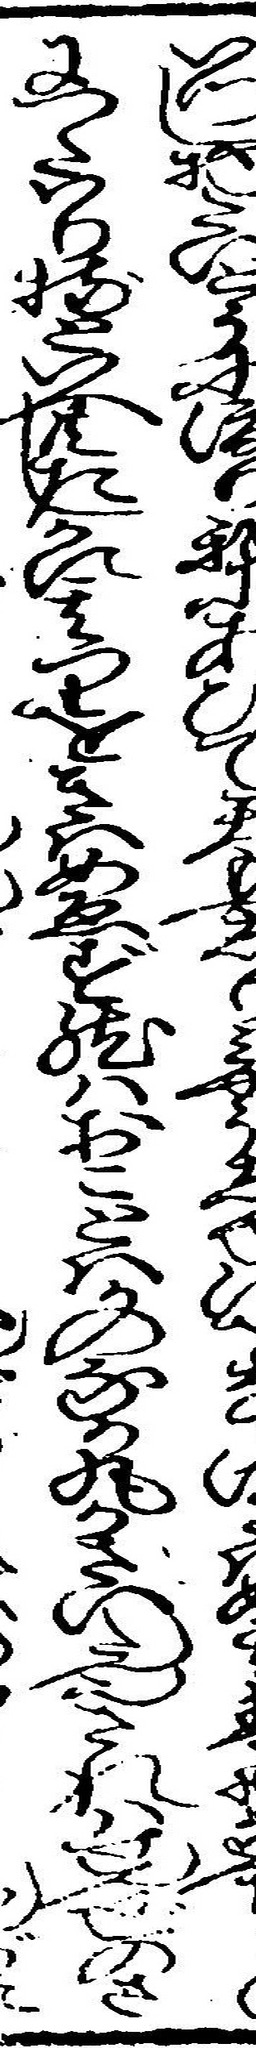につたはり持といへ共たしかに其りをきはめゑず然ばおことはかのなか丸かさいたん也されはせんせのさ
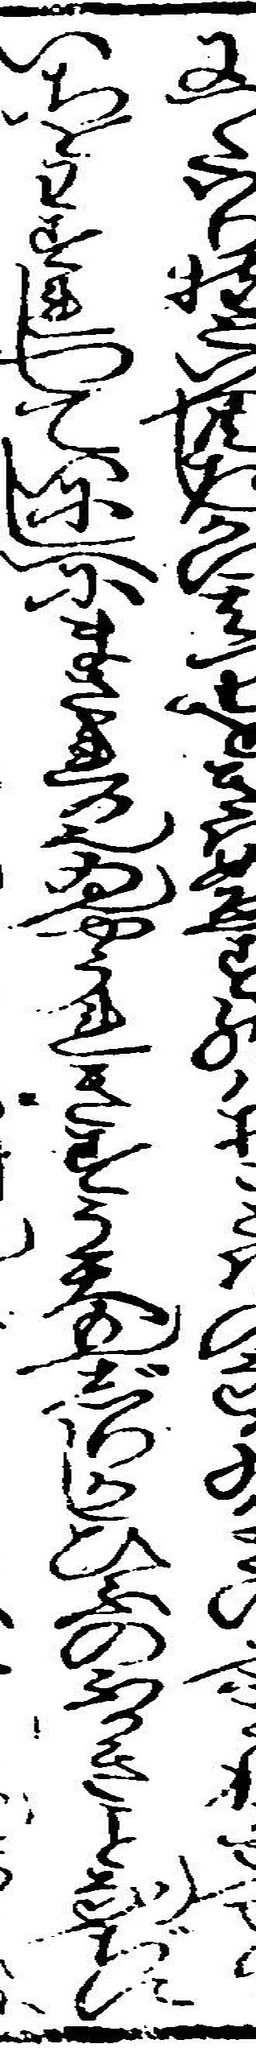いちをわすれつしていにしへにまされる也ゐんやうれきすう天もんじりかしひふのふるきことなんぢに
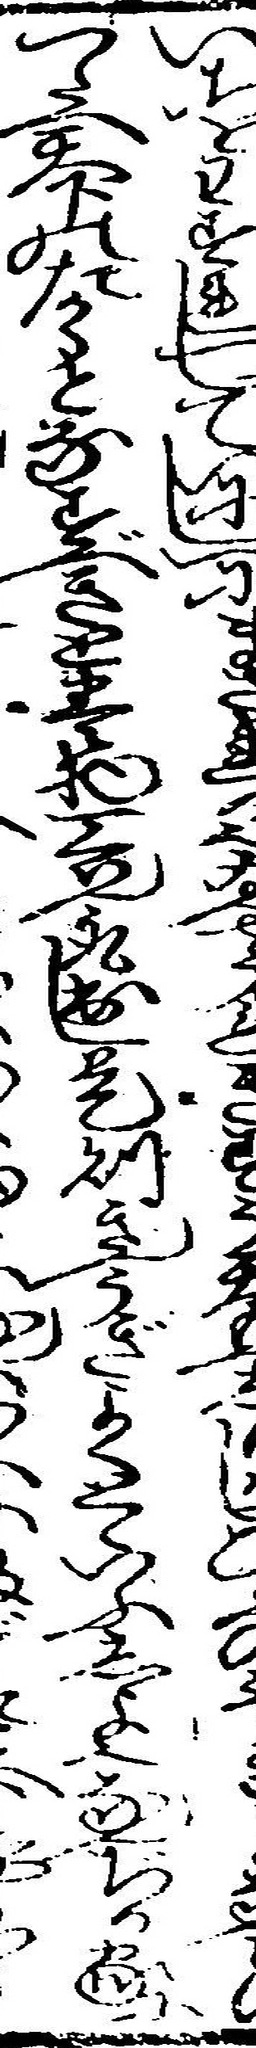つたへ天下のたからとなすべきと書物一くわん取出し是則きんうぎよくとゝいふしよ也なんぢか家に
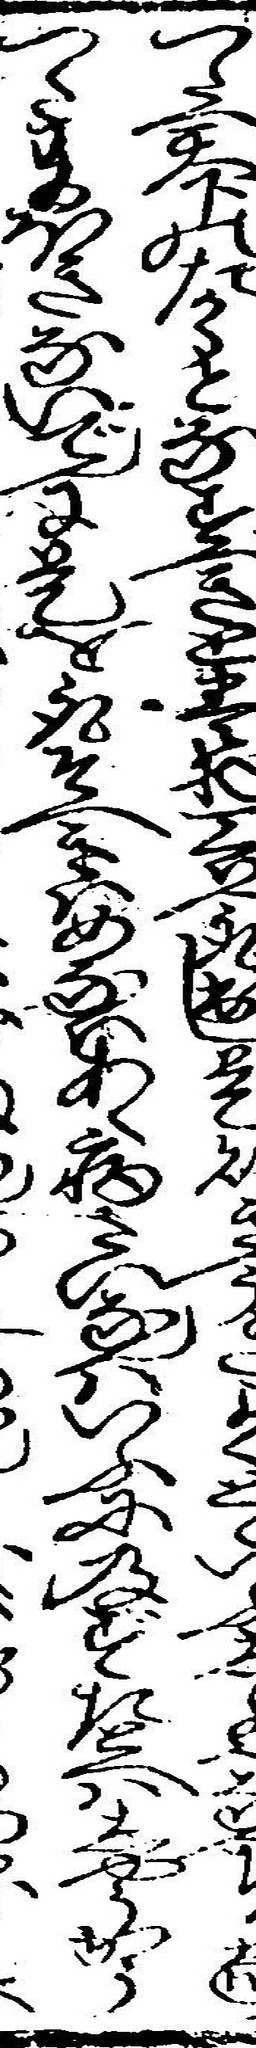つたわるほきないでんに是を取そへきはめなはあく病さいなんはいふに及ずたとへはしやうかう
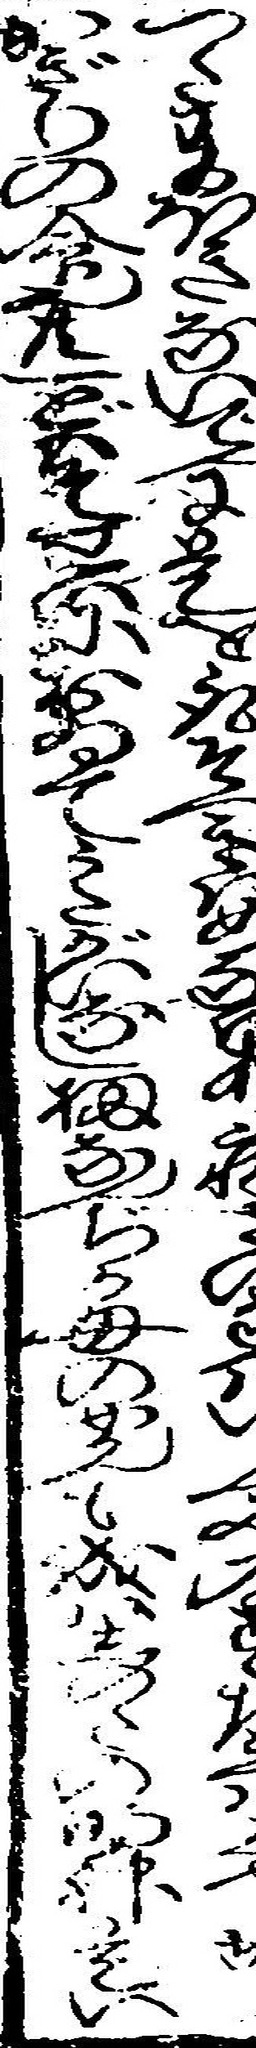かぎりの命也共一どはそせいにおゐてうたがいなし扨なんぢか母のやかんも誠はしのたの明神是い
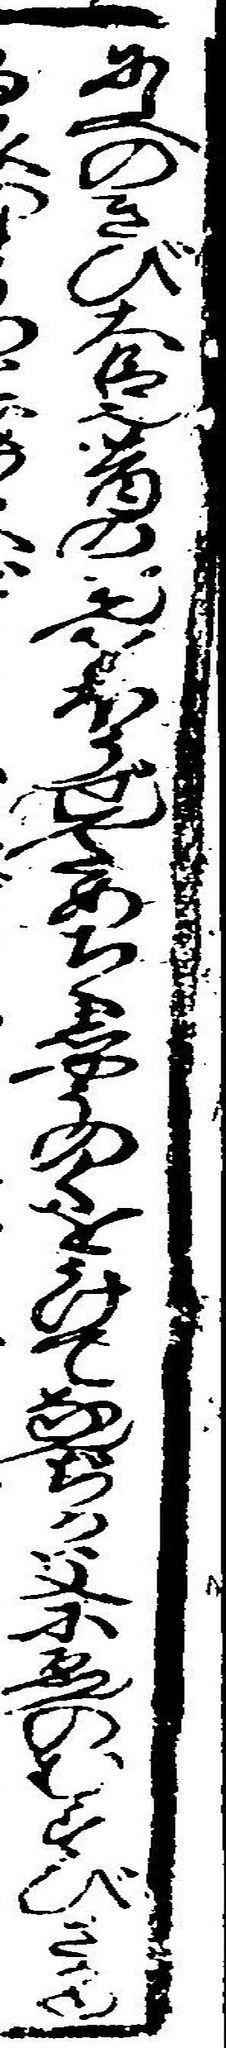にしへのきび大臣也昔？のんをほうぜんためちくしやうのくをうけてなんぢか父にゑんのむすびさかゆ
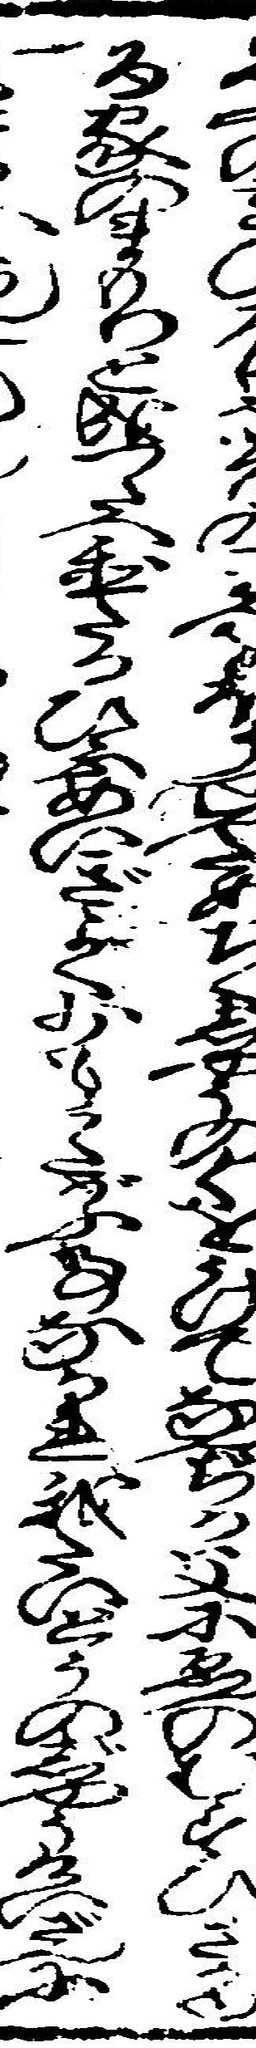る家のまもりと成つたへ置たるひふめいぎよく少もうたがふ事かれ我たいとうのじやうけいざんに
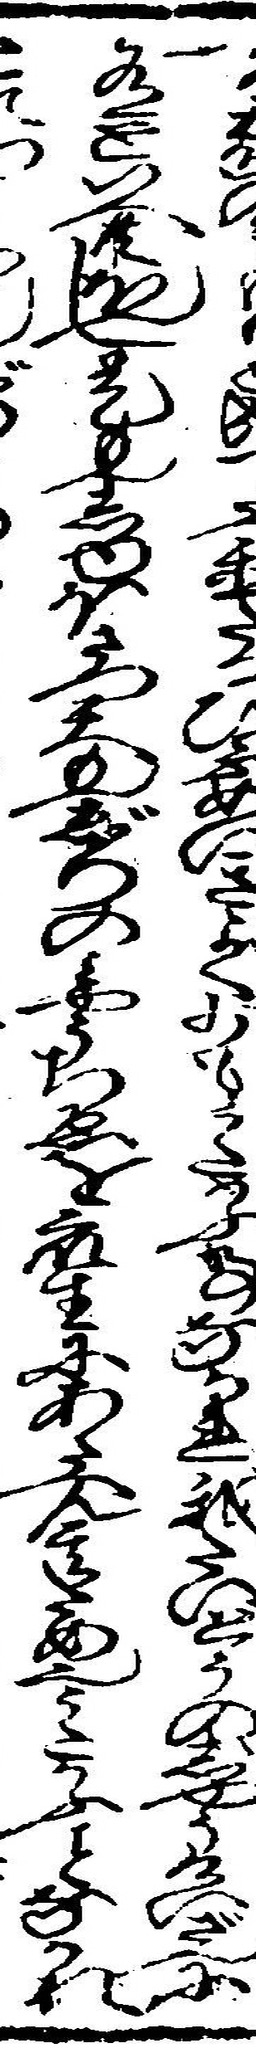有といへ共ほんし是もんしゆほさつ天もんじりのみやうちゑを衆生にあたへん其ため也うたかふことなかれ
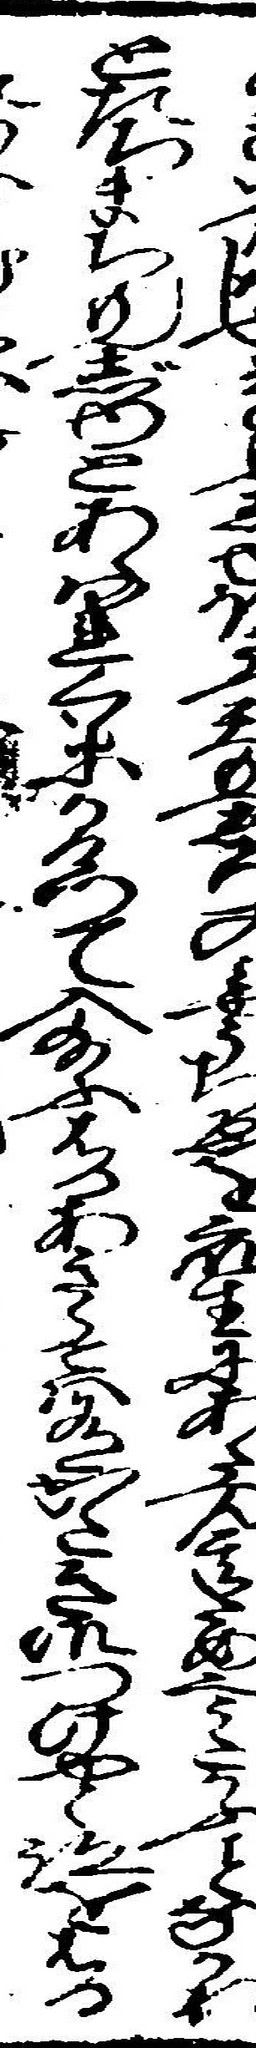とたちまちもんじゆとあらはれくも？にかけつて入給ふはるあきらこは有かたき御つけやと跡をはる
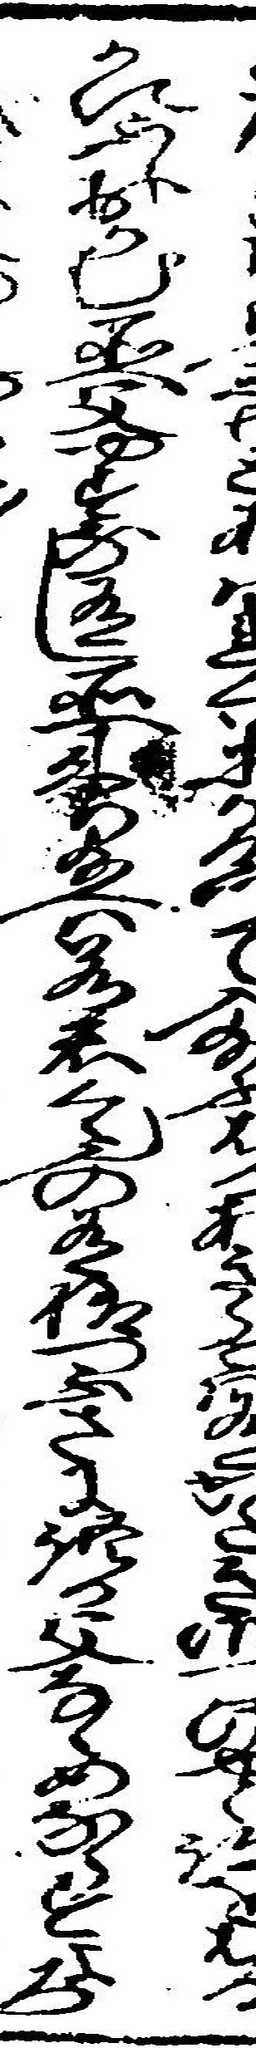かにふしおかむ所へ父やすな有し所へ来り給へは若君くたんの有様つふさに語る父なゝめならすよろ
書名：[しのだづまつりぎつね付あべの清明出生]
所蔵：東京大学総合図書館 General Library in the University of Tokyo, JAPAN
